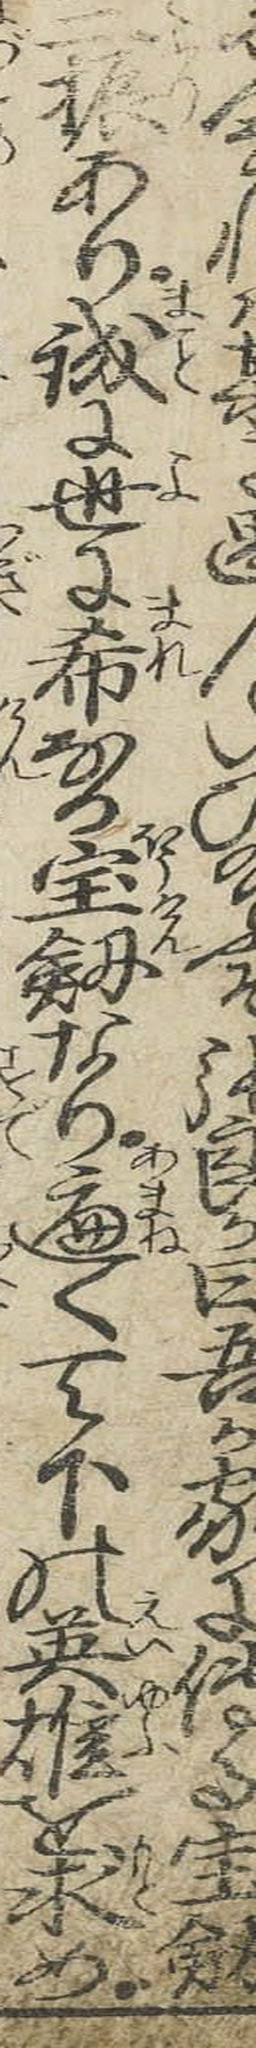三振あり。誠に世に希なる宝剣なり。遍く天下の英雄を求め。
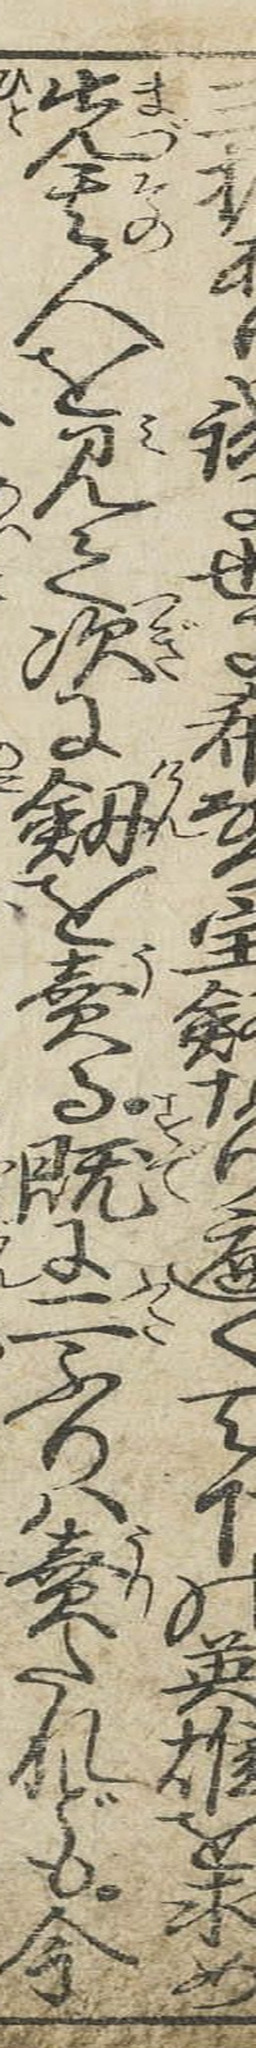先其人を見て次に剣を売る。既に二ふりは売たれども。今
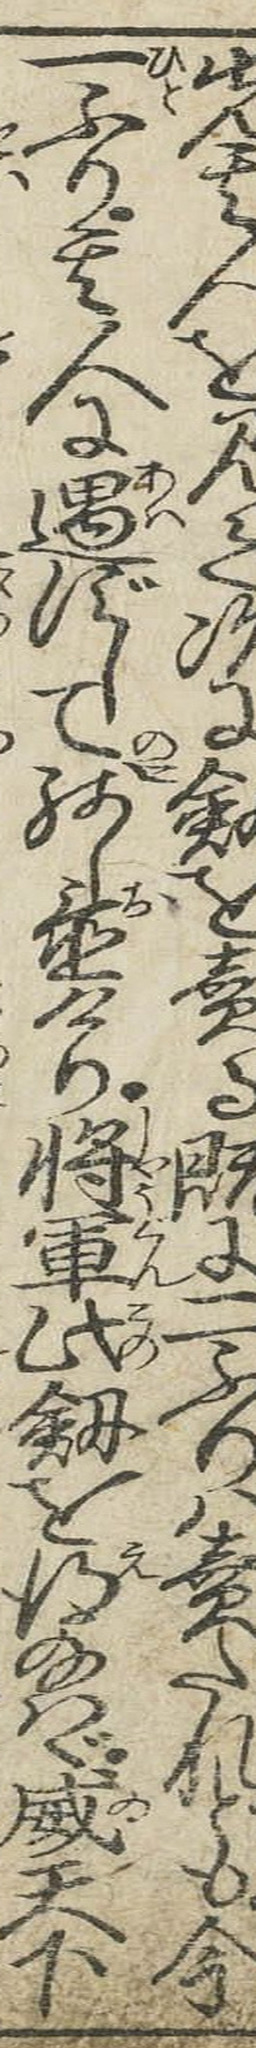一ふり。其人に遇ずして残し置けり。将軍此剣を得給はゞ。威天下
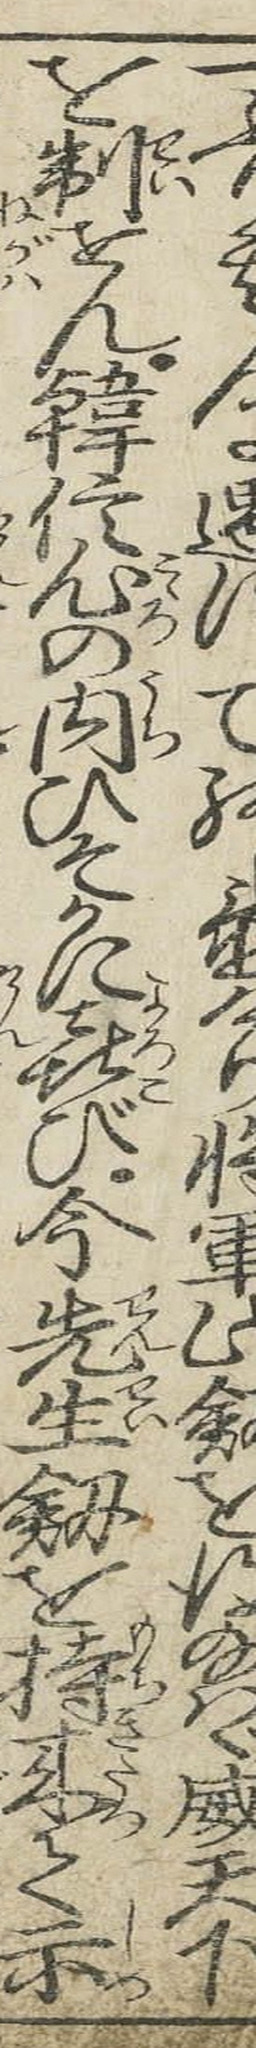を制せん。韓信心の内ひそかに喜び。今先生剣を持来て示
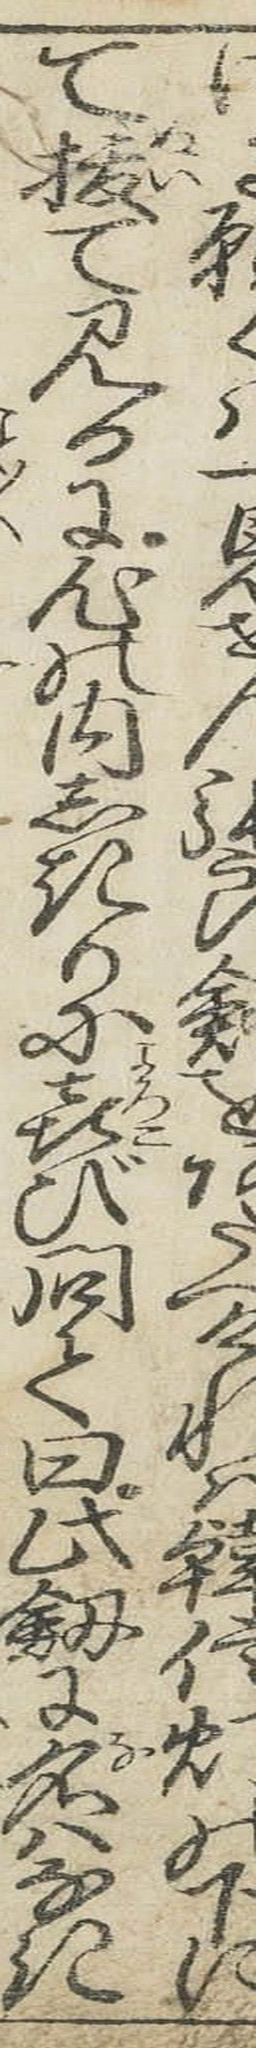て抜て見るに。心の内しきりに喜び問て曰。此剣に名はなき
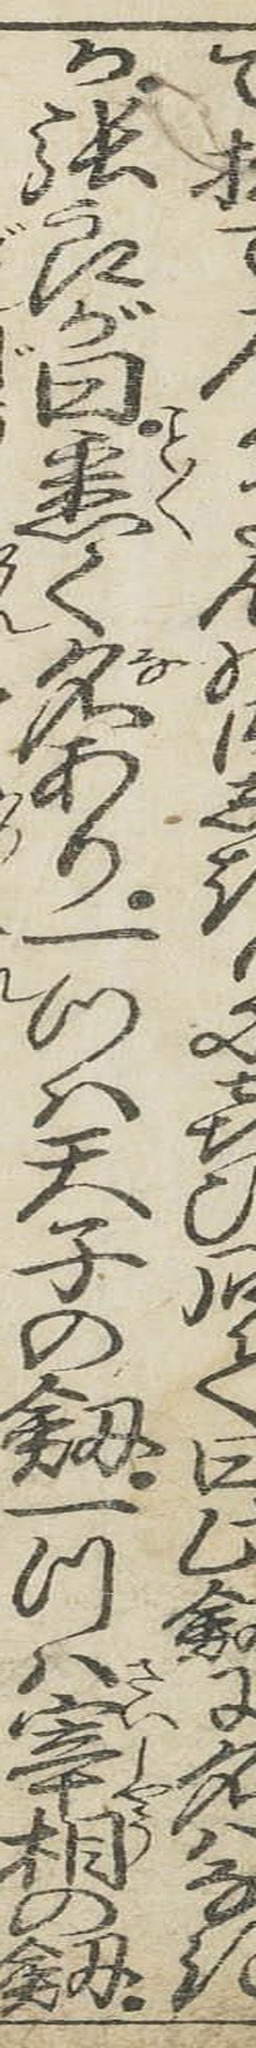か。張良が曰。悉く名あり。一つは天子の剣。一つは宰相の剣。
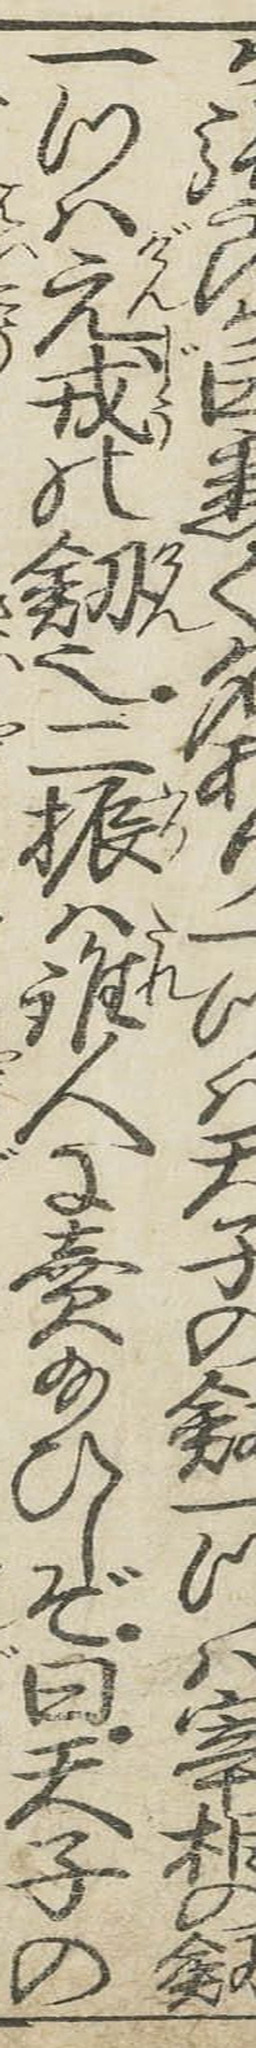一つは元戎の剣也。二振は誰人に売給ひしぞ。曰。天子の
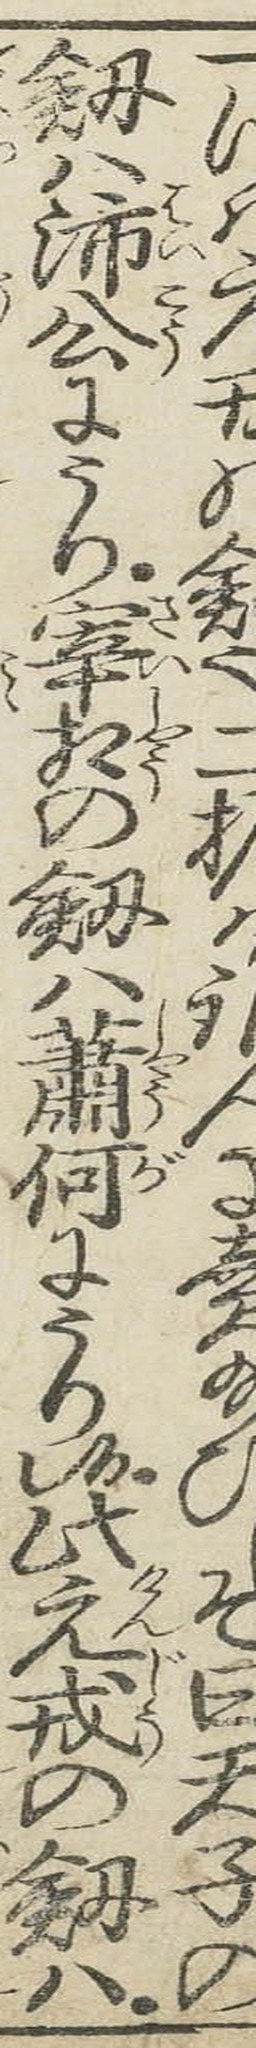剣は沛公にうり。宰相の剣は蕭何にうり候。元戎の剣は。
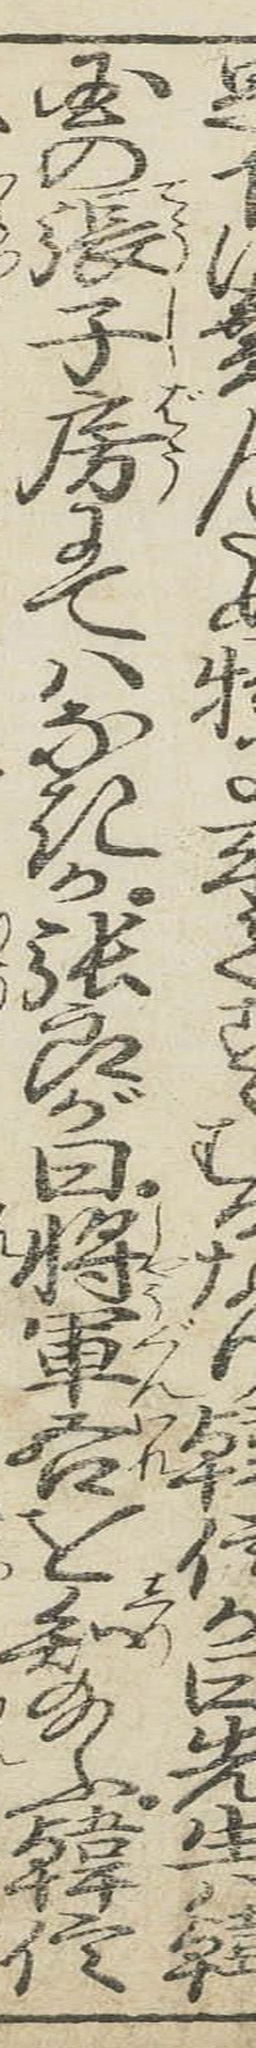国の張子房にてはなきか。張良が曰。将軍吾を知給ふ。韓信
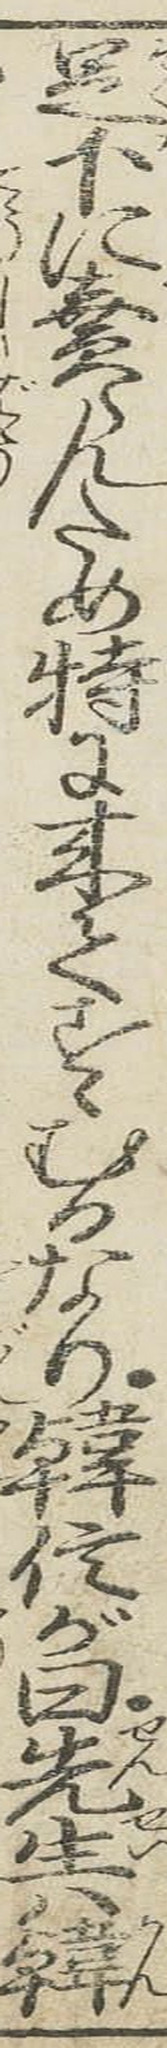足下に売らんため特に来てすゝむるなり。韓信が曰。先生は韓
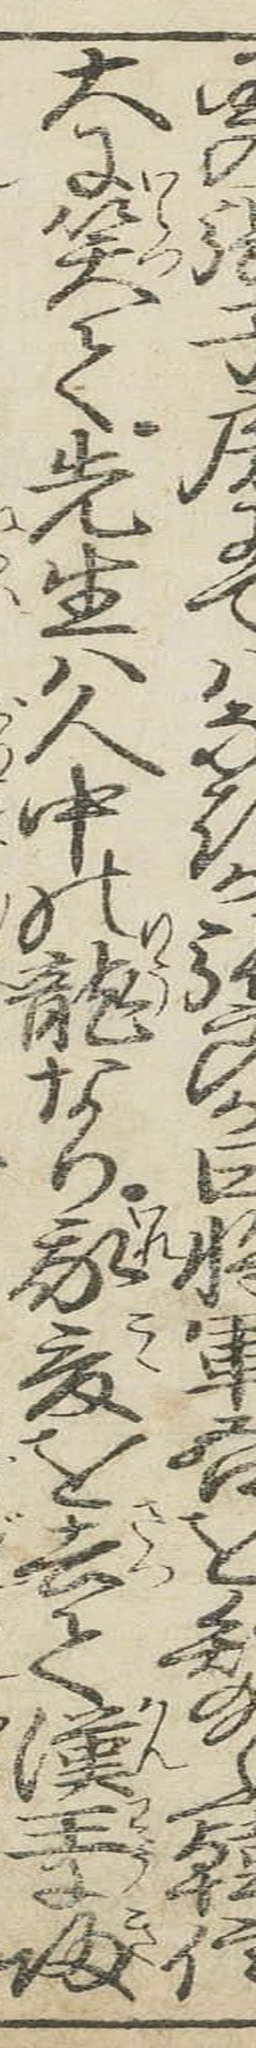大に笑て。先生は人中の竜なり。我爰を去て漢王に帰
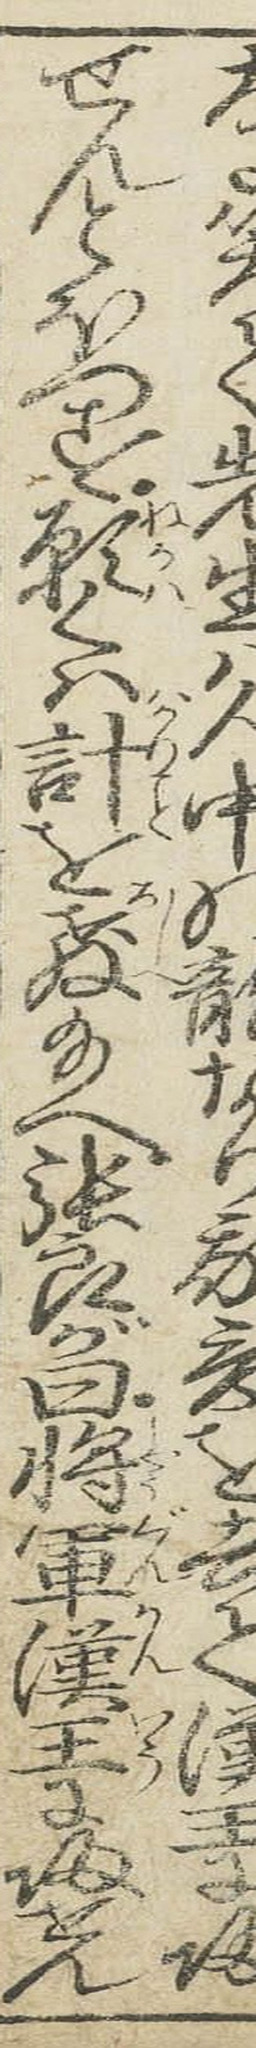せんとほつす。願くは計を教給へ。張良が曰。将軍漢王に帰せん
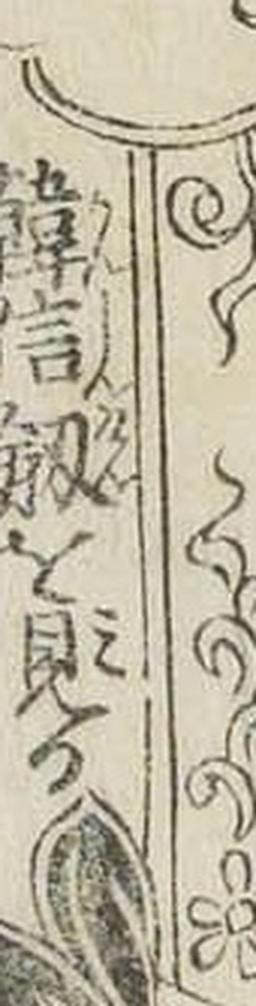韓信剣を見る
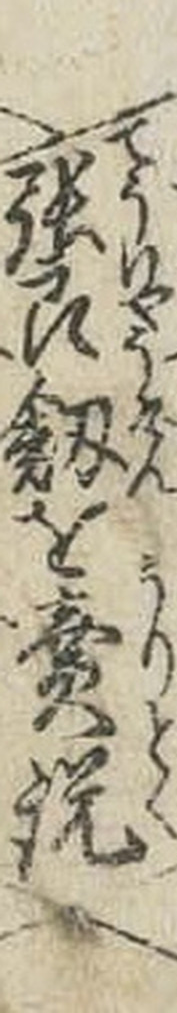張良剣を売説

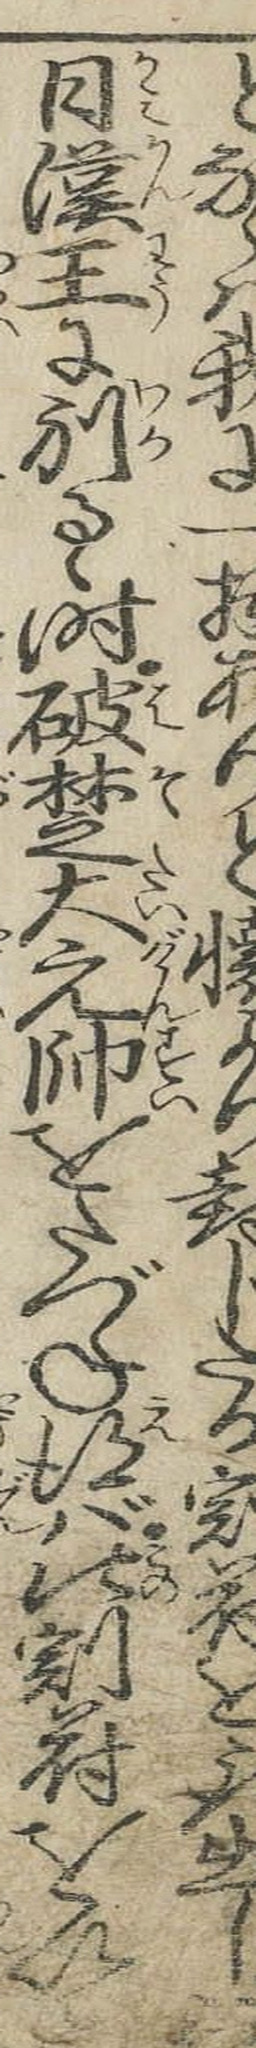日漢王に別るゝ時。破楚大元帥をたづね得ば。此割符を以て
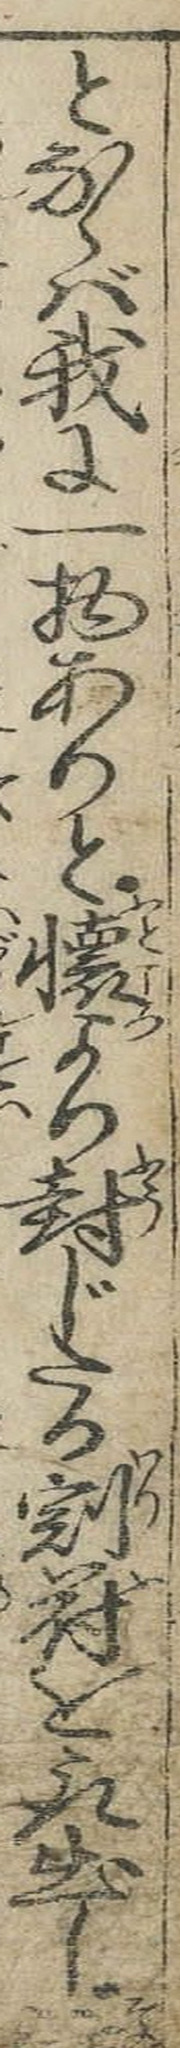とならば我に一物ありと。懐より封じたる割符を取出し。往
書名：絵本写宝袋 9巻 7之巻
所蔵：東京学芸大学教育コンテンツアーカイブ
